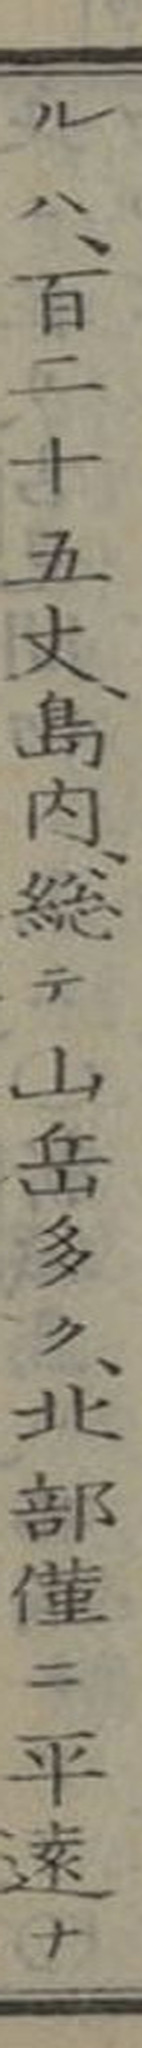ルハ、百二十五丈、島内、総テ山岳多ク、北部僅ニ平遠ナ
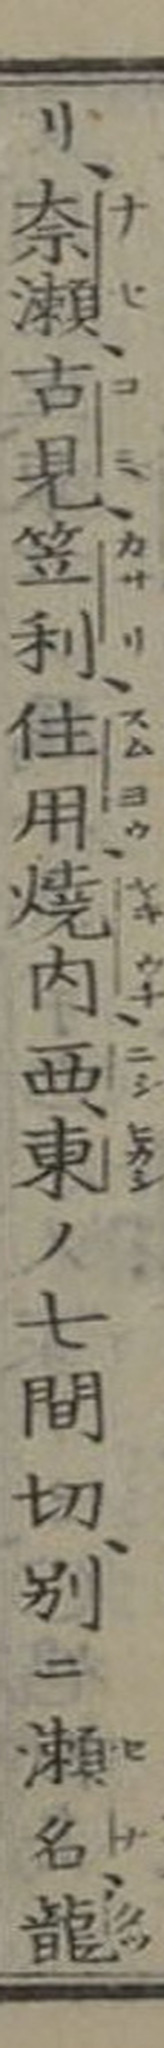リ、奈瀬、古見、笠利、住用、焼内、西、東ノ七間切、別ニ瀬名、竜
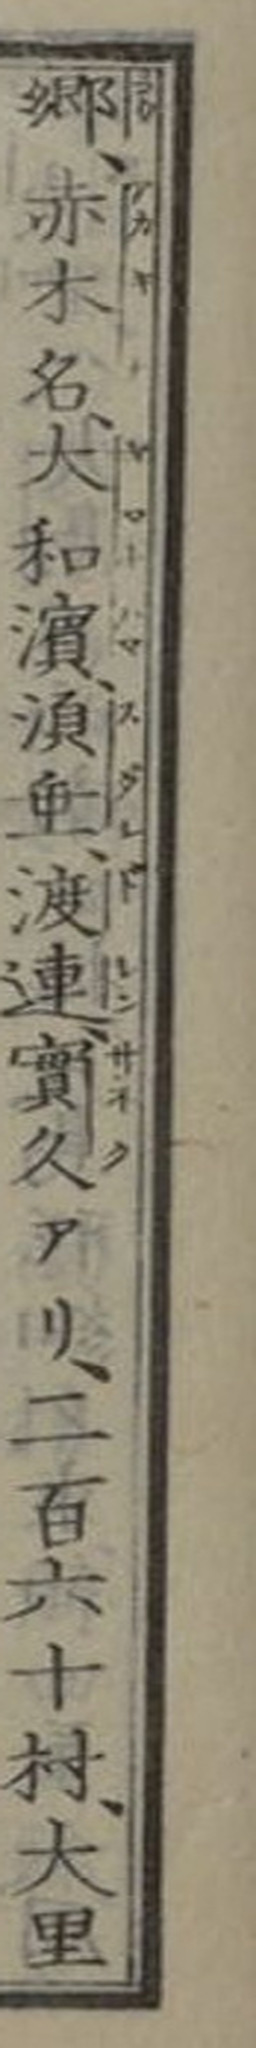郷、赤木名、大和浜、須垂、渡連、実久アリ、二百六十村、大里
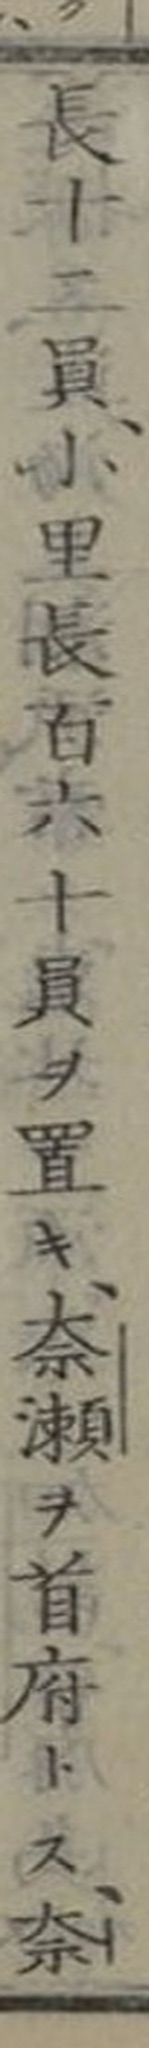長十二員、小里長百六十員ヲ置キ、奈瀬ヲ首府トス、奈
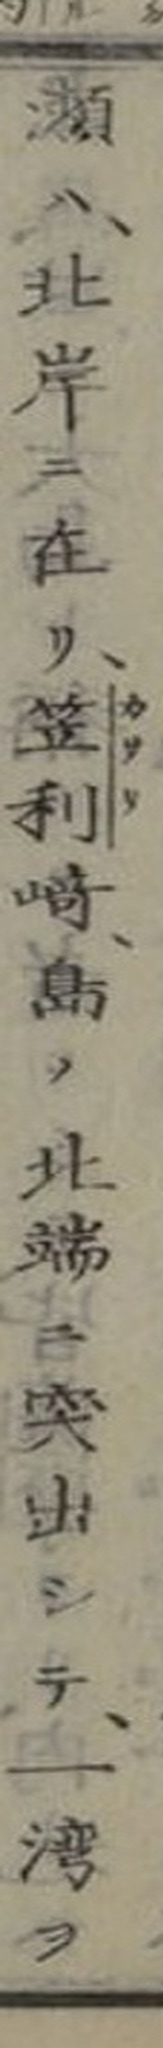瀬ハ、北岸ニ在リ、笠利崎、島ノ北端ニ突出シテ、一湾ヲ
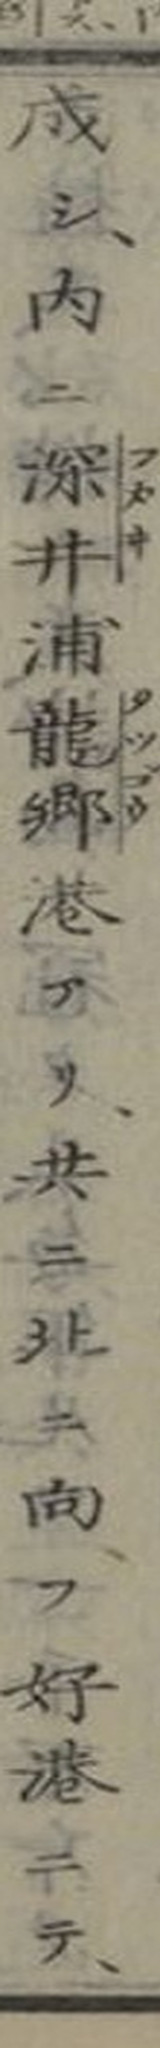成シ、内ニ深井浦竜郷港アリ、共ニ北ニ向フ好港ニテ、
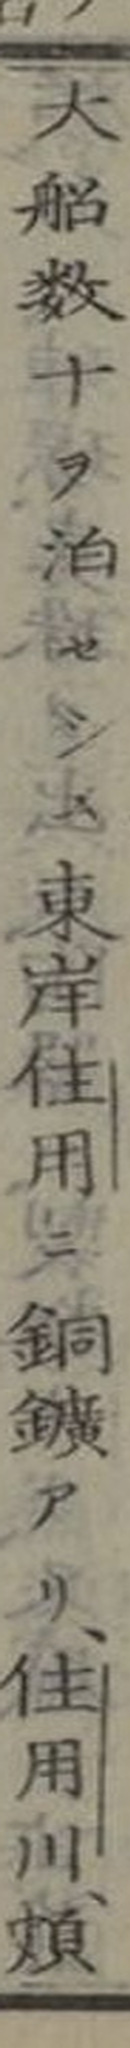大船数十ヲ泊セシム、東岸住用ニ銅鉱アリ、住用川、頗
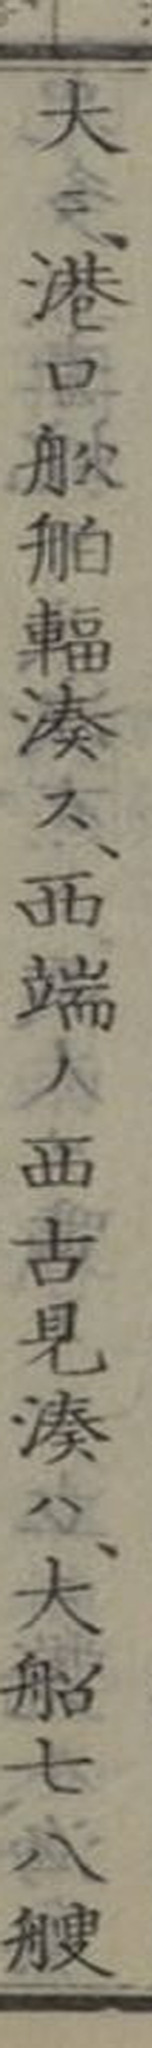大ニ、港口船舶輻湊ス、西端ノ西古見湊ハ、大船七八艘
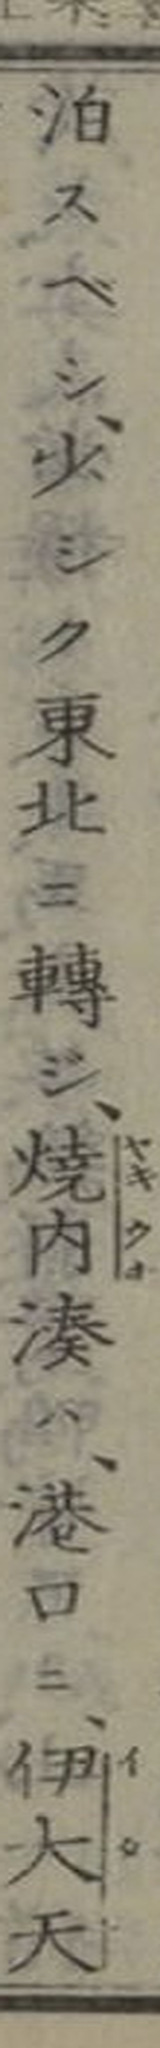泊スベシ、少シク東北ニ転ジ、焼内湊ハ、港口ニ、伊大天
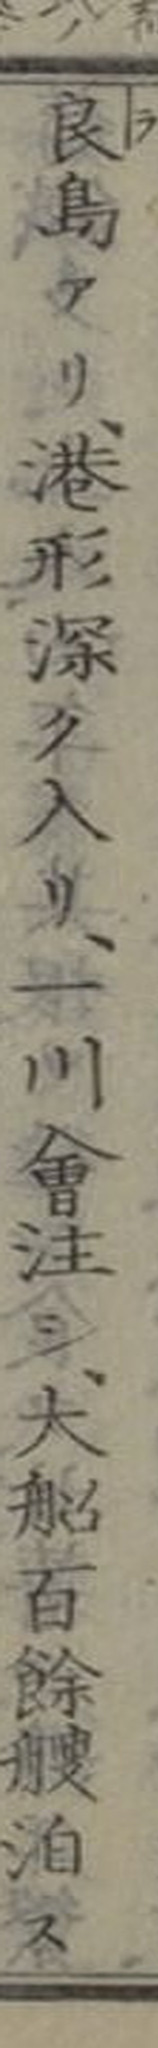良島アリ、港形深ク入リ、一川会注シ、大船百余艘泊ス
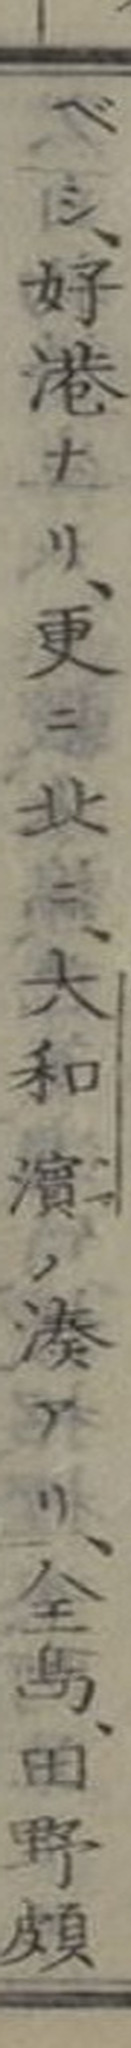ベシ、好港ナリ、更ニ北ニ、大和浜ノ湊アリ、」全島、田野頗
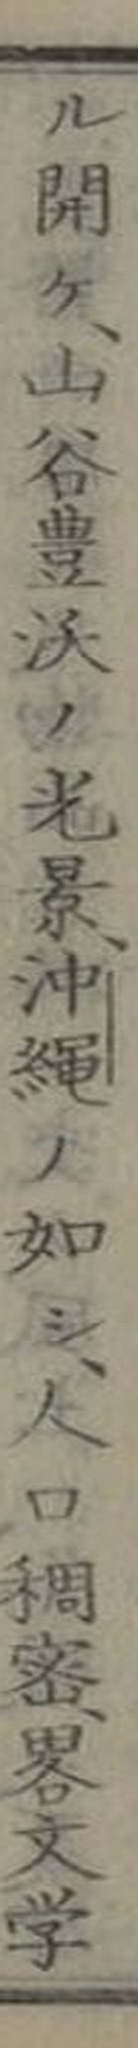ル開ケ、山谷豊沃ノ光景、沖縄ノ如シ、人口稠密、略文学
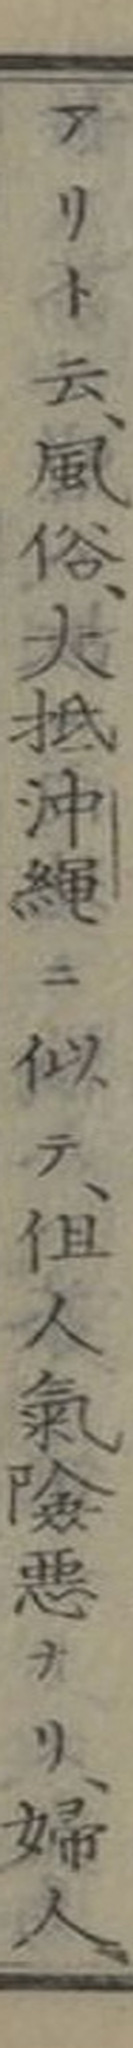アリト云、風俗、大抵沖縄ニ似テ、但人気険悪ナリ、婦人、

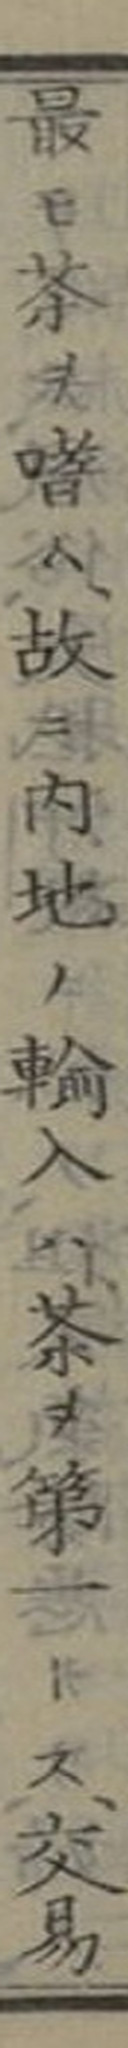最モ茶ヲ嗜ム、故ニ内地ノ輸入ハ、茶ヲ第一トス、交易
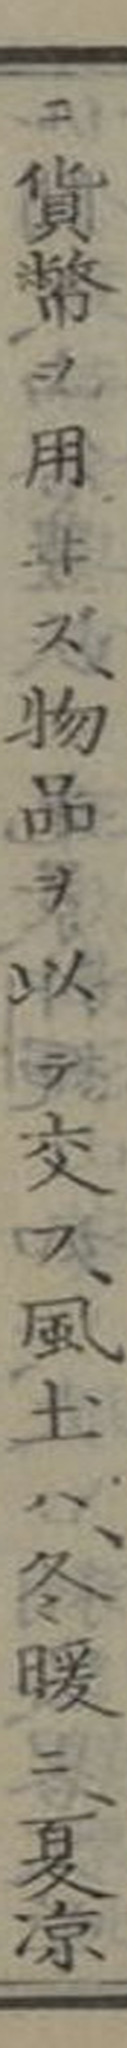ニ貨幣ヲ用ヰズ、物品ヲ以テ交フ、風土ハ、冬暖ニ、夏涼
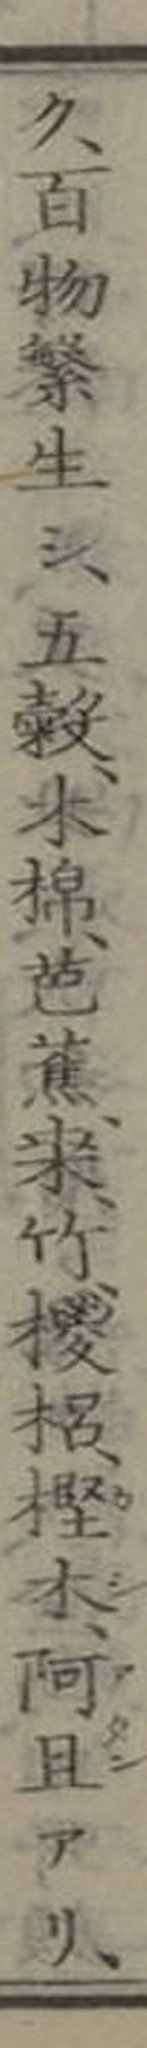ク、百物繁生シ、五穀、木棉、芭蕉、桑、竹、棕梠、樫木、阿且アリ、
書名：琉球新誌 図附 上
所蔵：University of the Ryukyus Library
